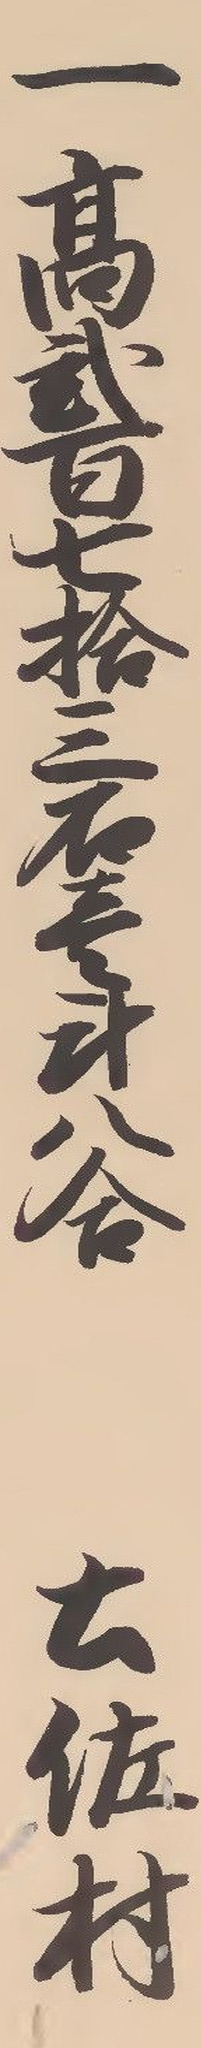一高弐百七拾三石壱斗八合土佐村
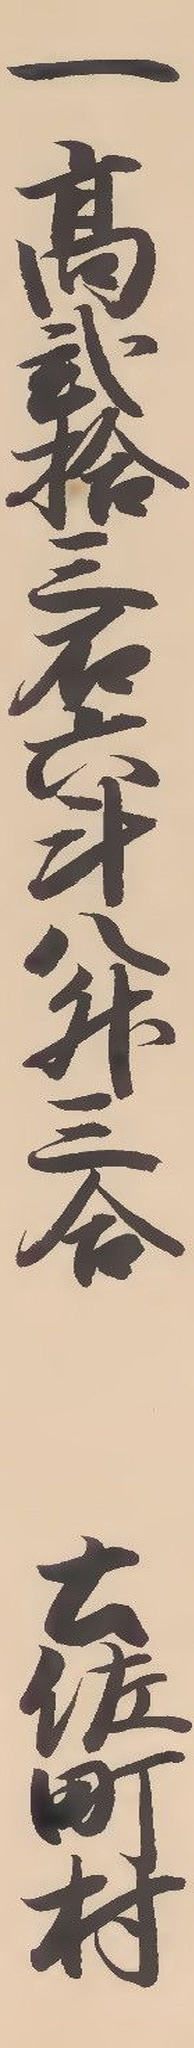一高弐拾三石六斗八升三合土佐町村
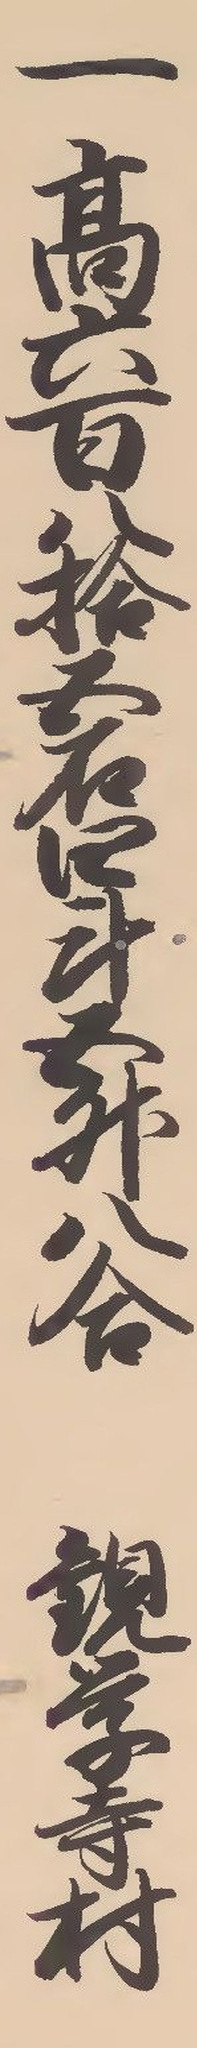一高六百八拾五石四斗五升八合観学寺村

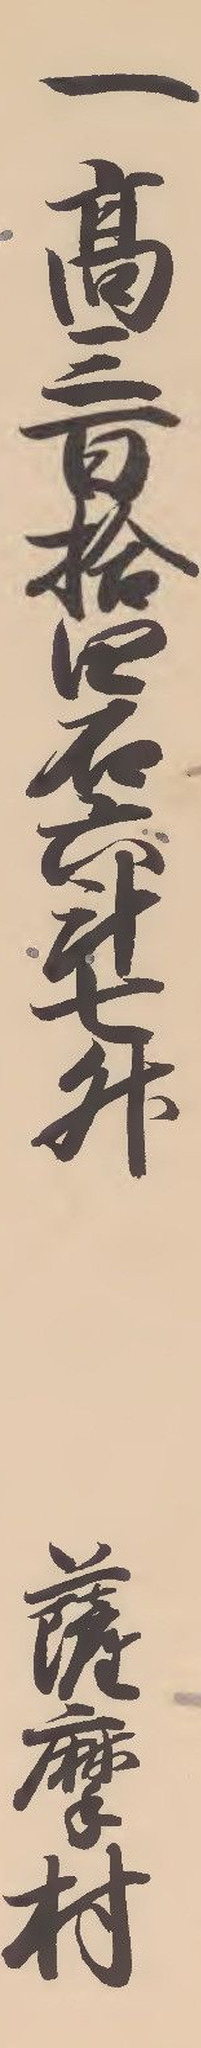一高三百拾四石六斗七升薩摩村
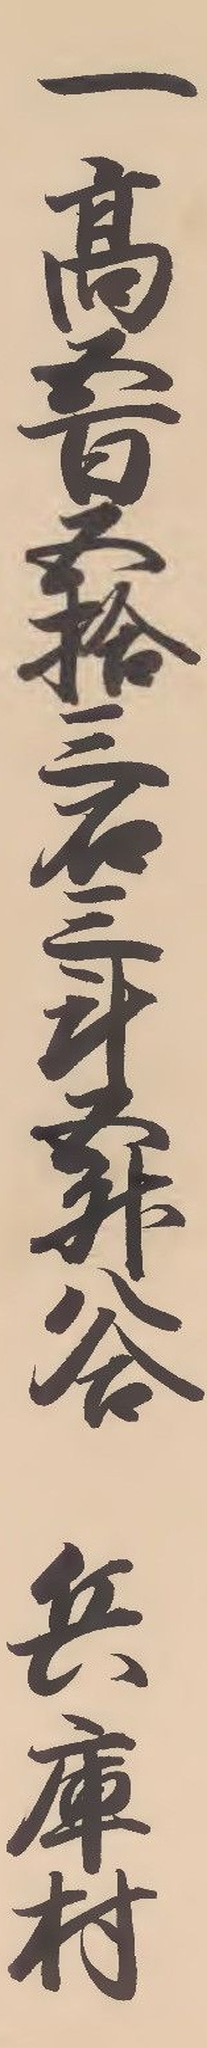一高五百五拾三石三斗五升八合兵庫村
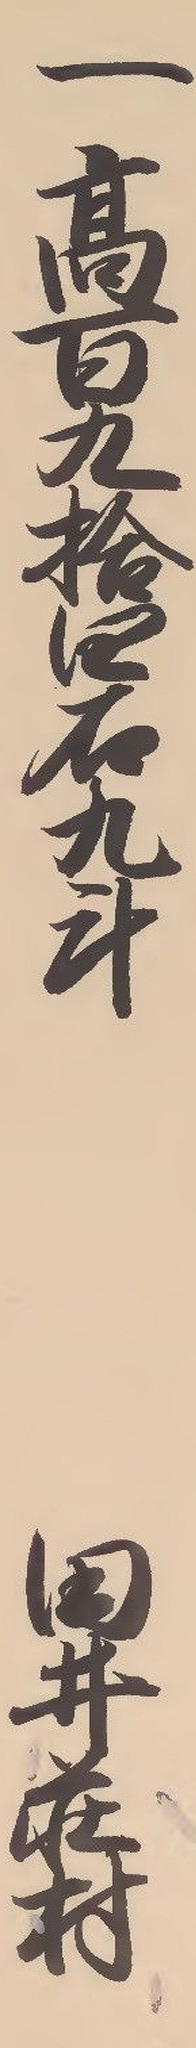一高百九拾四石九斗田井荘村
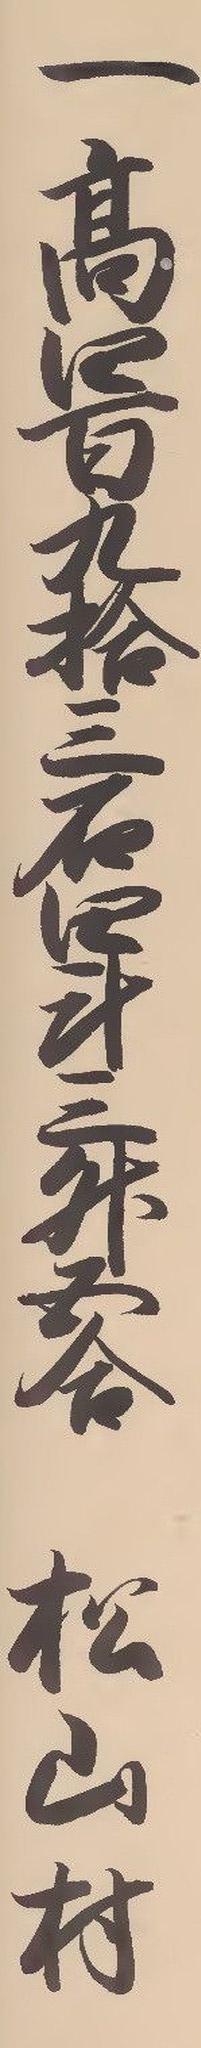一高四百九拾三石四斗三升五合松山村
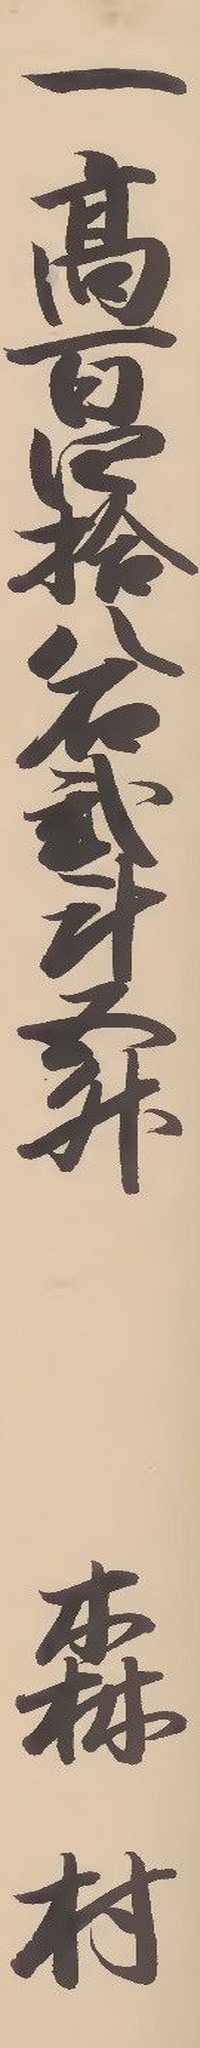一高百四拾八石弐斗五升森村
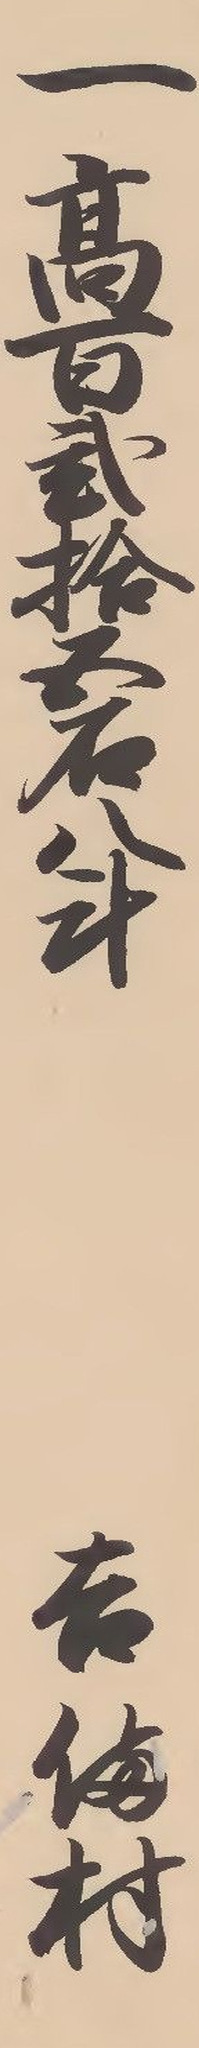一高百弐拾五石八斗吉備村
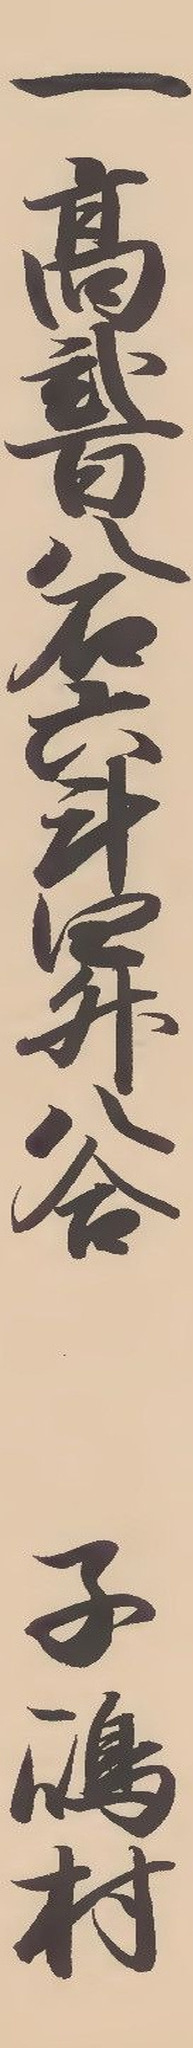一高弐百八石六斗四升八合子島村

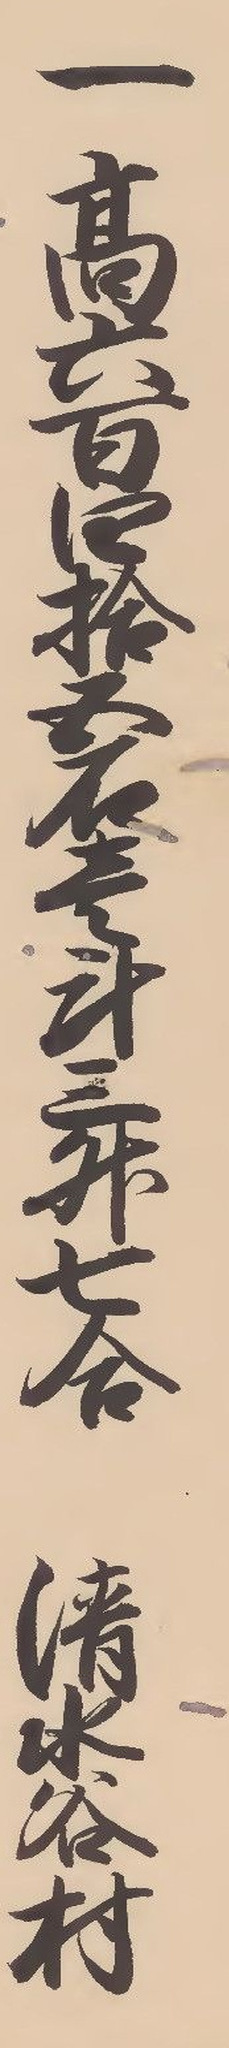一高六百四拾五石壱斗三升七合清水谷村
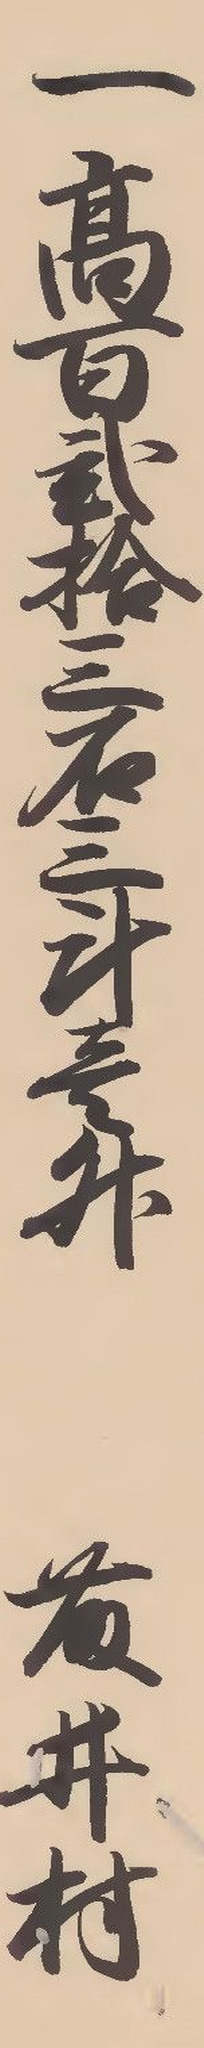一高百弐拾三石三斗壱升藤井村
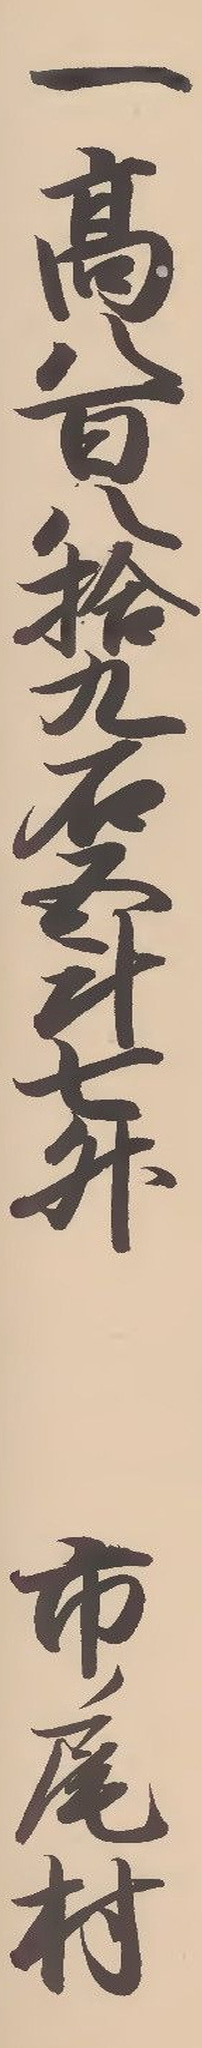一高八百八拾九石五斗七升市ノ尾村
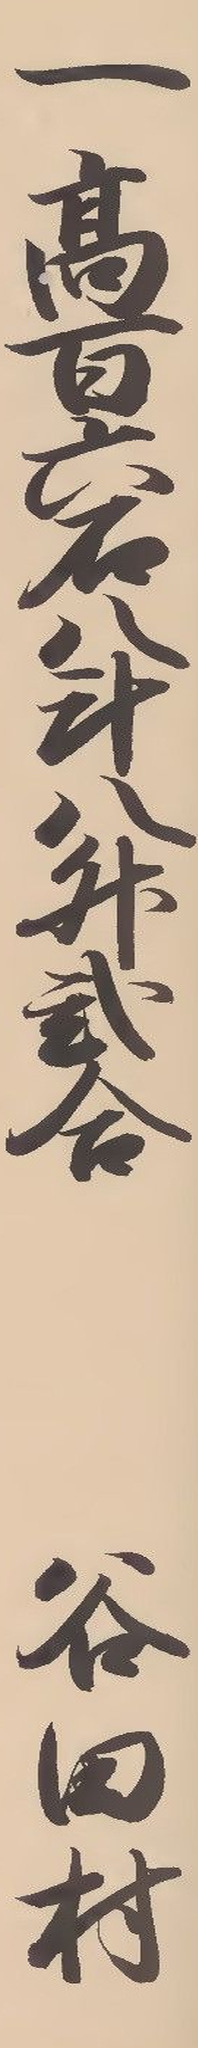一高百六石八斗八升弐合谷田村
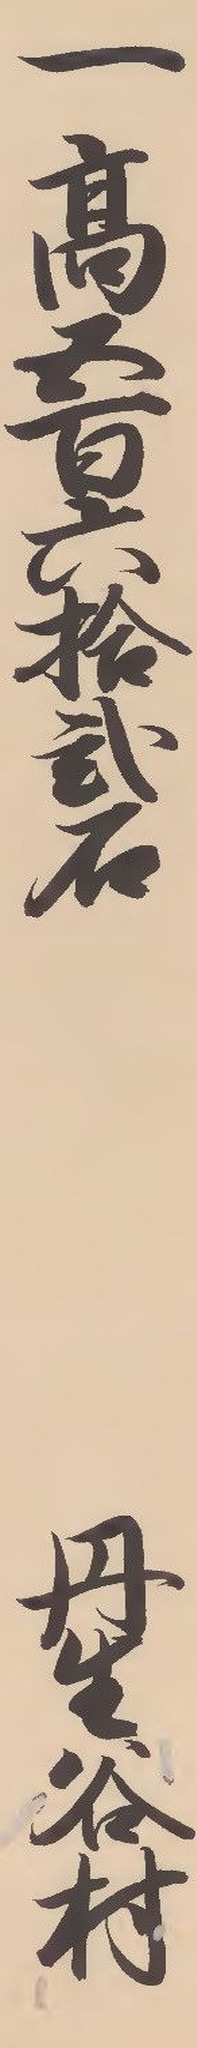一高五百六拾弐石丹生谷村
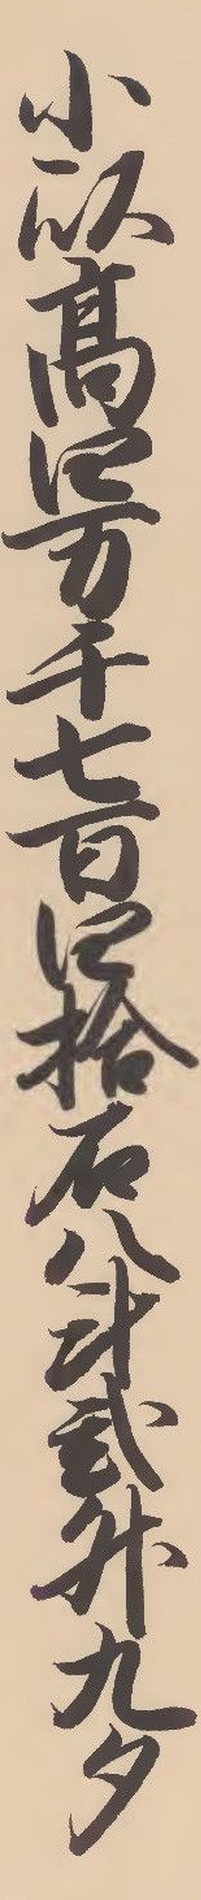小以高四万千七百四拾石八斗弐升九勺
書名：大和国郷帳
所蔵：国立公文書館 National Archives of Japan
